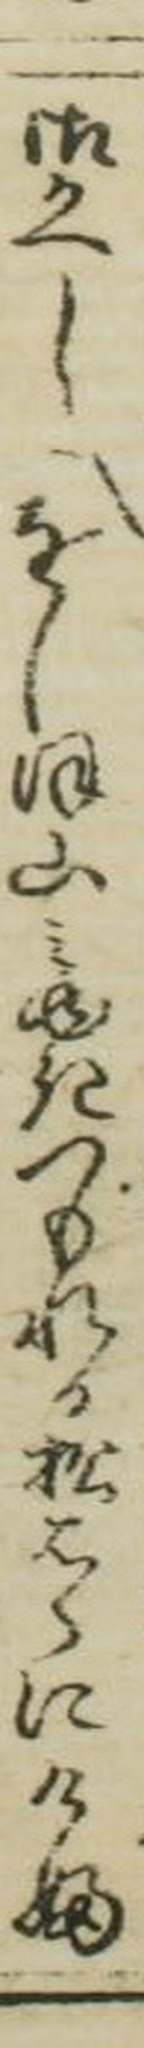御かへし〽をしほ山みゆきつもれる松はらにけふ
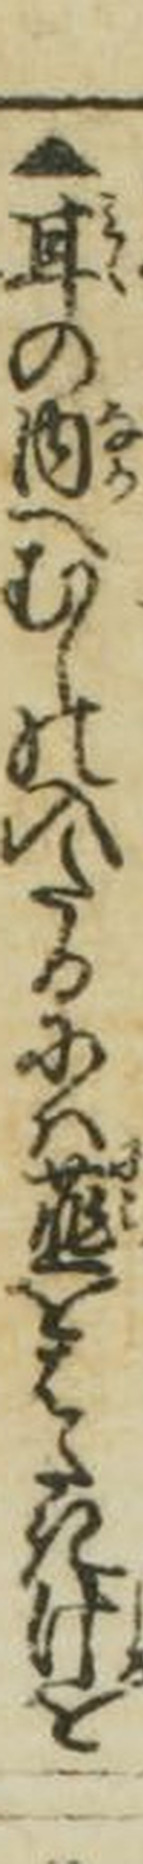▲耳の内へむしの入たるには韮をはたき汁を
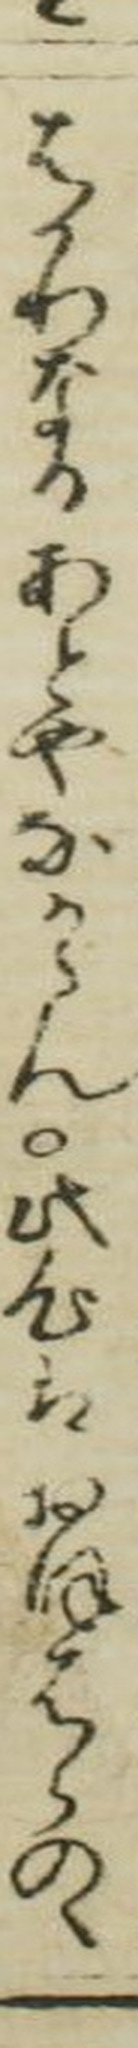はかりなるあとやなからん◯此心はおほはらのゝ
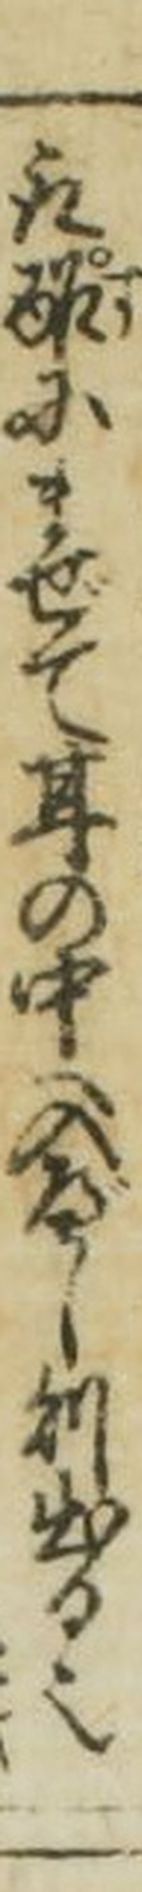取。酢にまぜて耳の中へ入べし則出る也
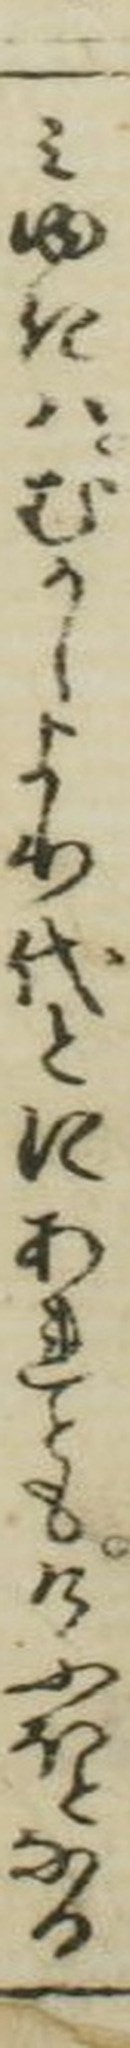みゆきは。むかしより代々にあれとも。けふほとなる
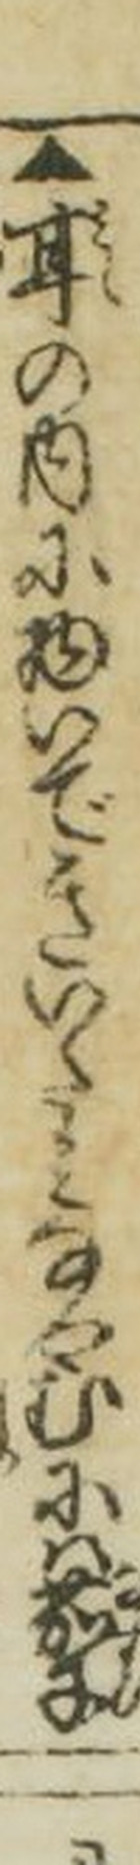▲耳の内に物いできいたみなやむには茄子
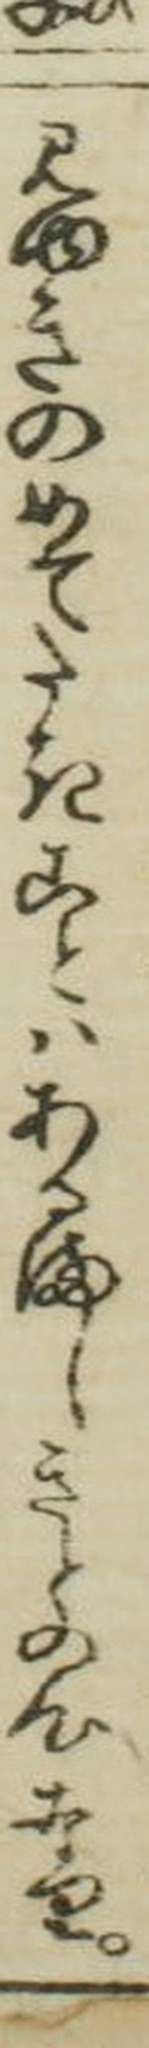みゆきのめてたきことはあるましきとの心なり。
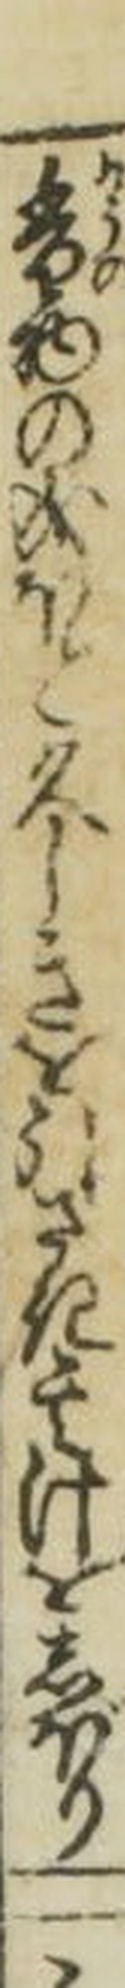香物の成ほど久しきを引さき其汁をしぼり
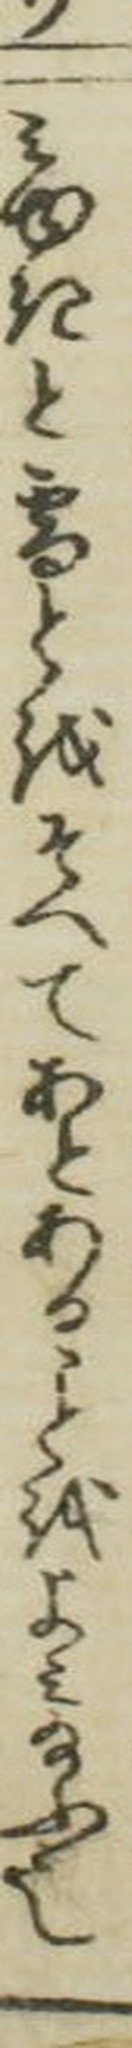みゆきと雪とをそへてあとあることをよみ給ふ也
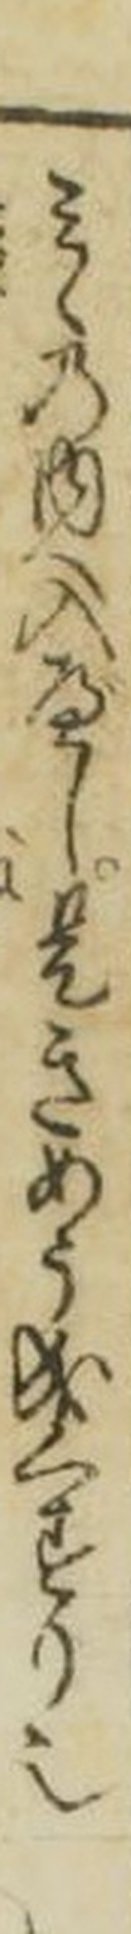みゝの内へ入べし。是きめう成くすり也
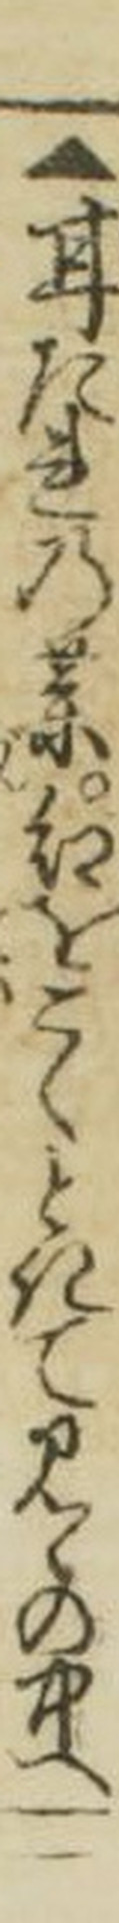▲耳たれの薬。紅をこくときてみゝの中へ
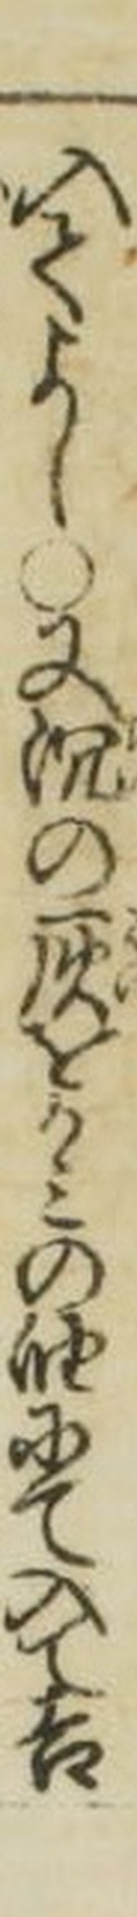入てよし◯又沈の灰をかみの油にて入て吉
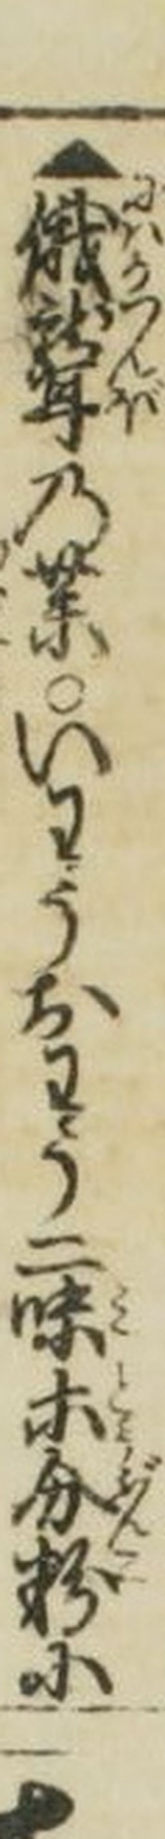俄聾の薬◯いわうおわう二味等分粉に
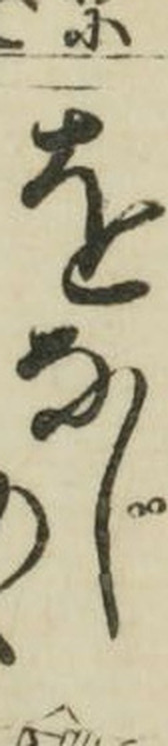をなじ
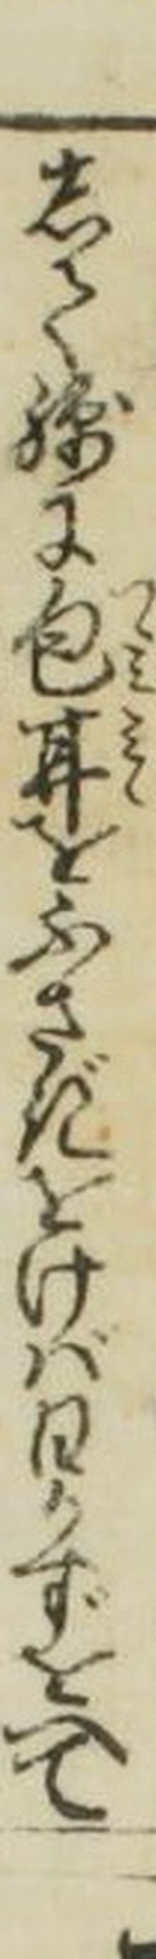して綿に包耳をふさぎをけば日かずをへて
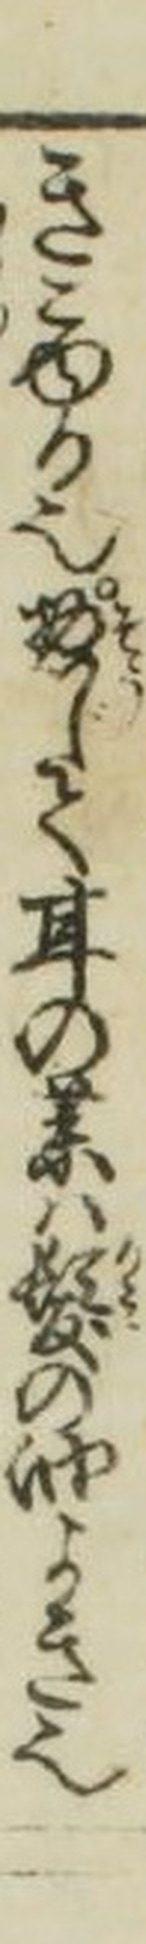きこゆる也。惣じて耳の薬は髪の仲よき也
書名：女源氏教訓鑑
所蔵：東京学芸大学附属図書館
